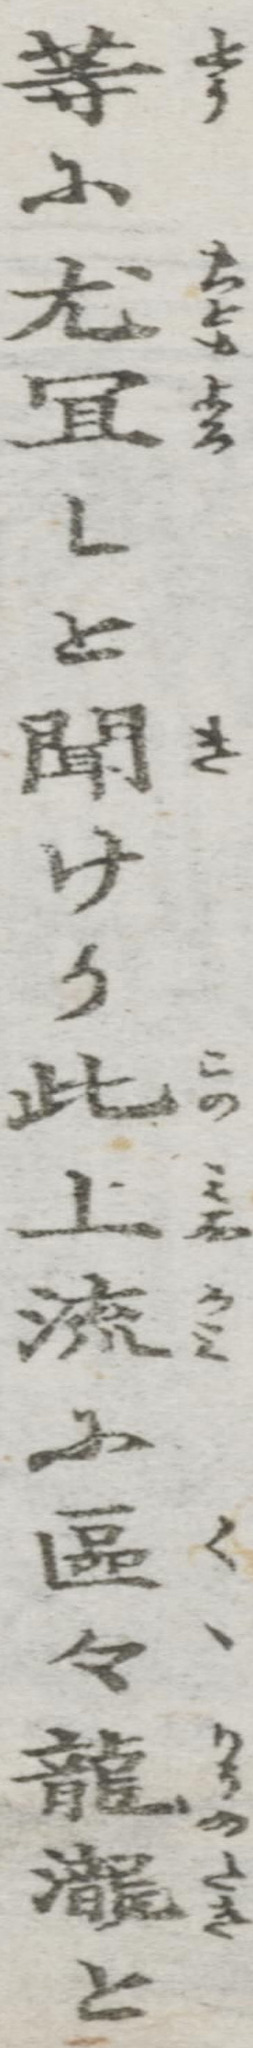等に尤宜しと聞けり此上流に区々竜滝と
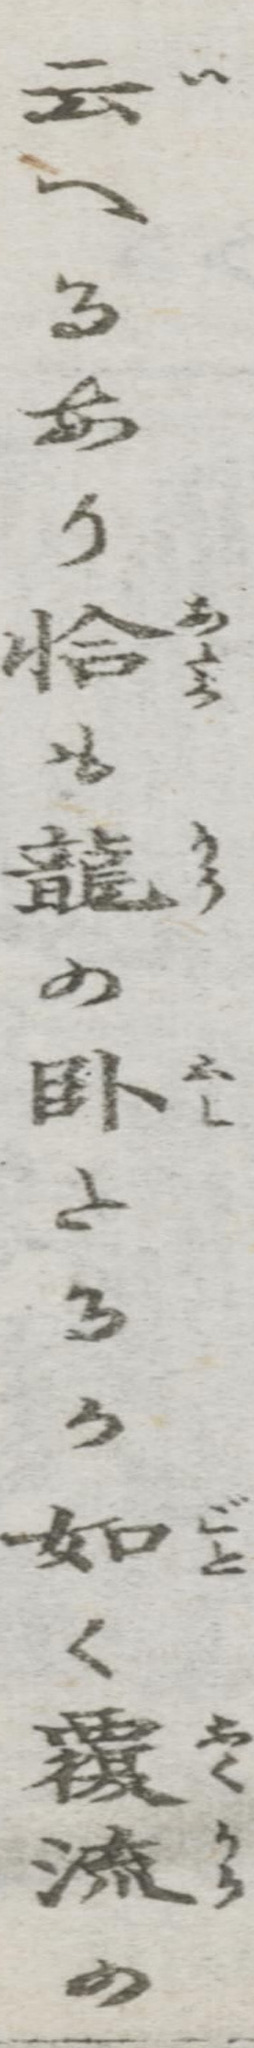云へるあり恰も竜の臥たるか如く覆流の
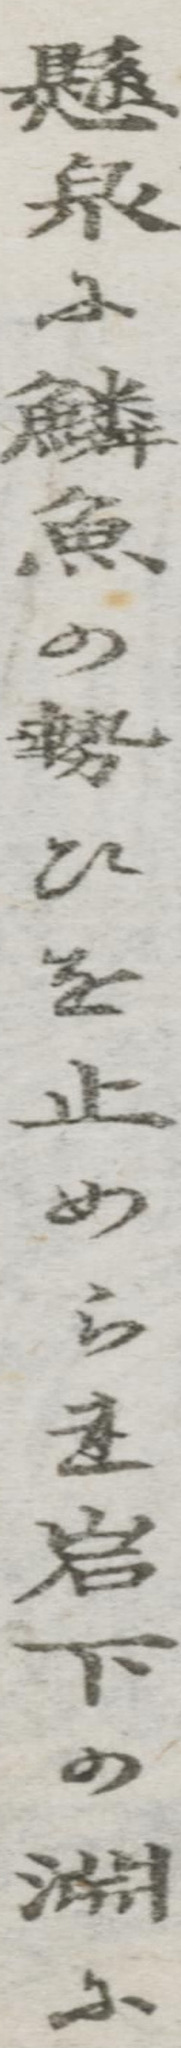懸泉に鱗魚の勢ひを止められ岩下の淵に
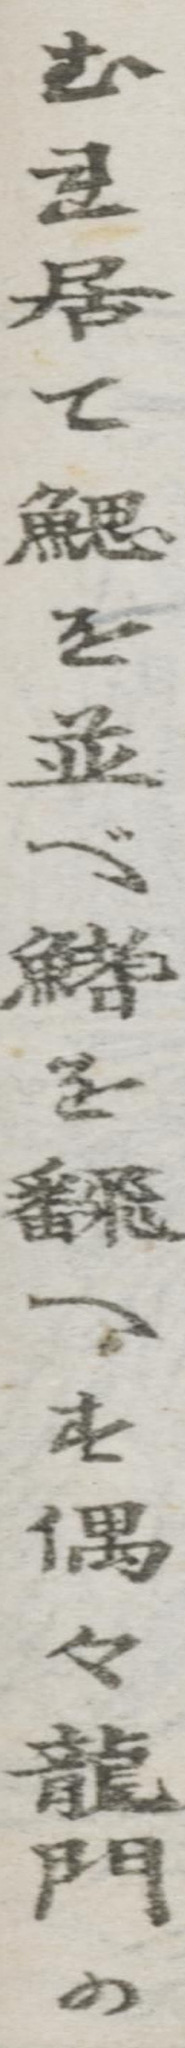むれ居て鰓を並べ鰭を飜へす偶々竜門の
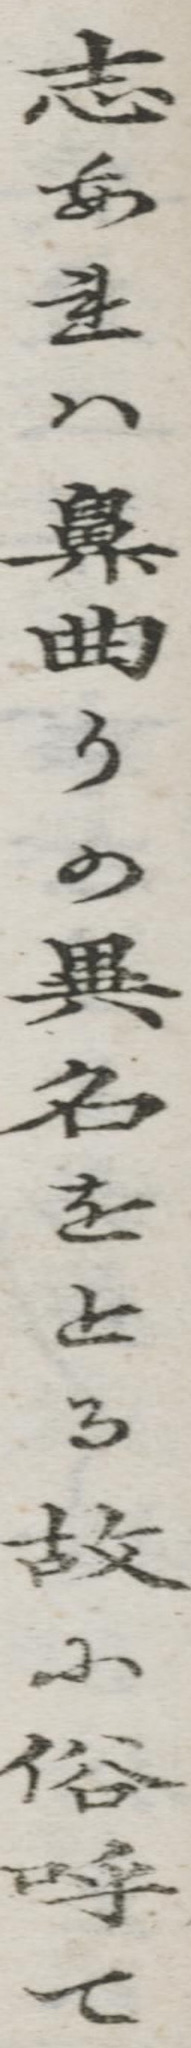志あれは鼻曲りの異名をとる故に俗呼て
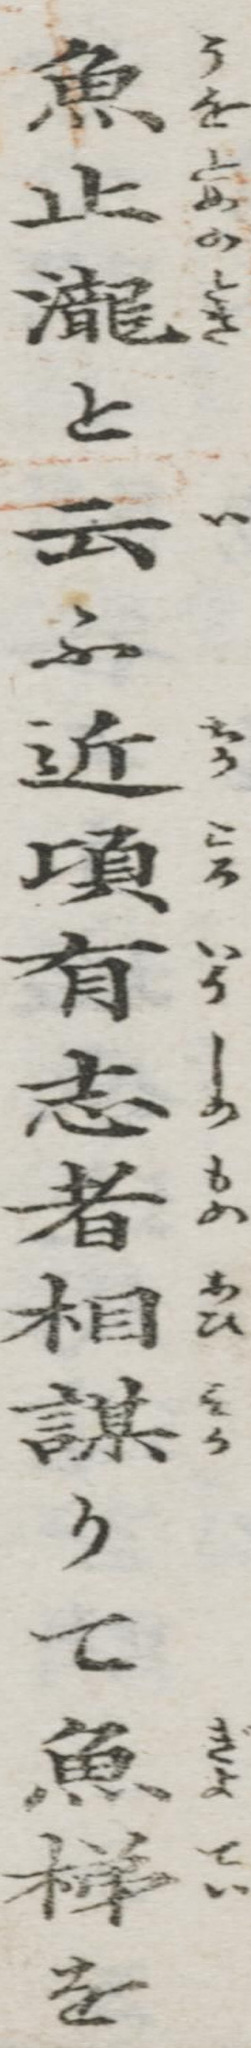魚止滝と云ふ近頃有志者相謀りて魚梯を
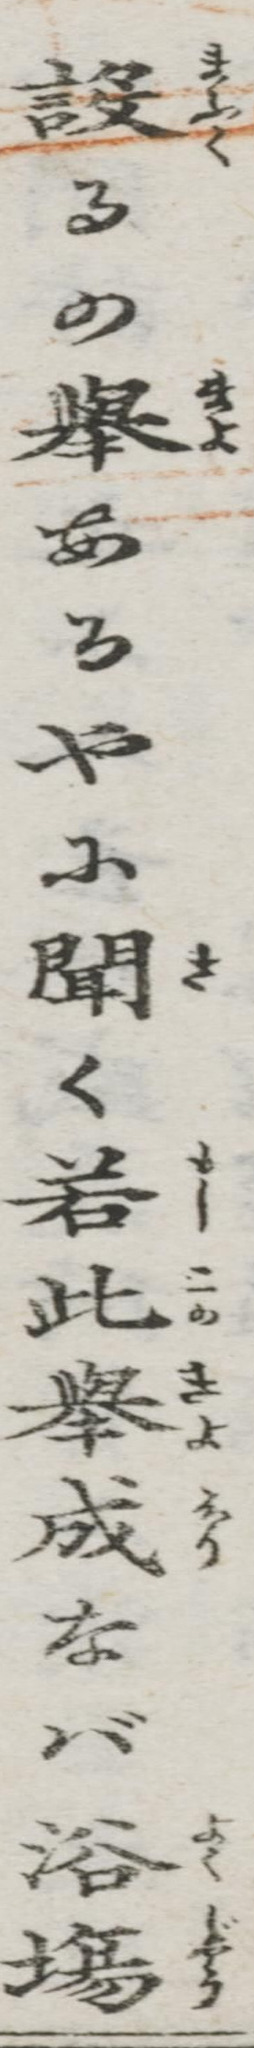設るの挙あるやに聞く若此挙成なば浴場
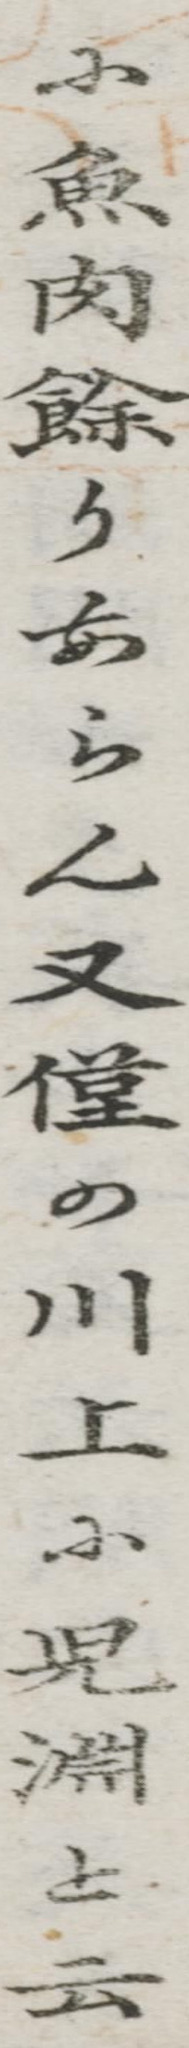に魚肉余りあらん又僅の川上に児淵と云
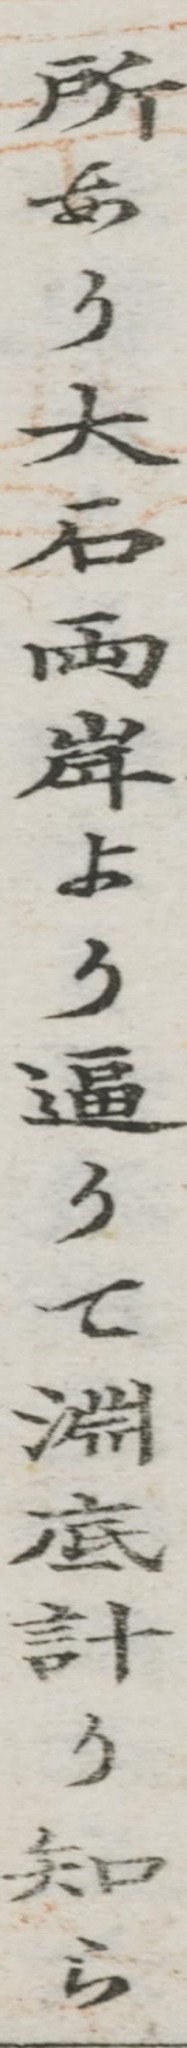所あり大石両岸より逼りて淵底計り知ら
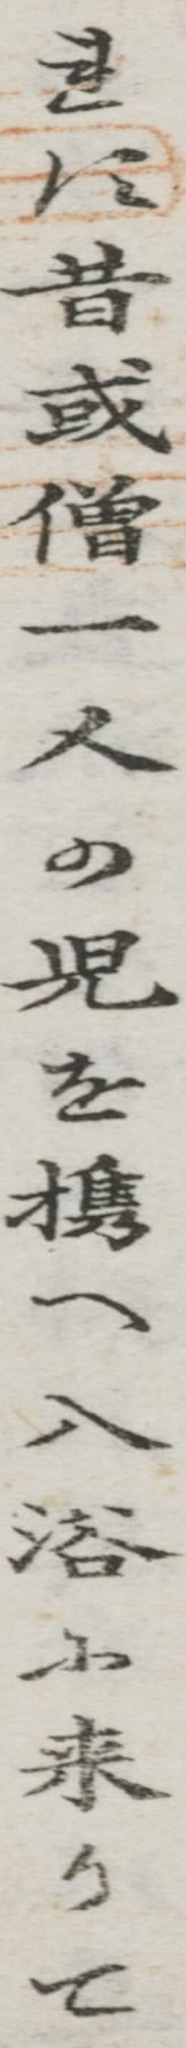れす昔或僧一人の児を携へ入浴に来りて
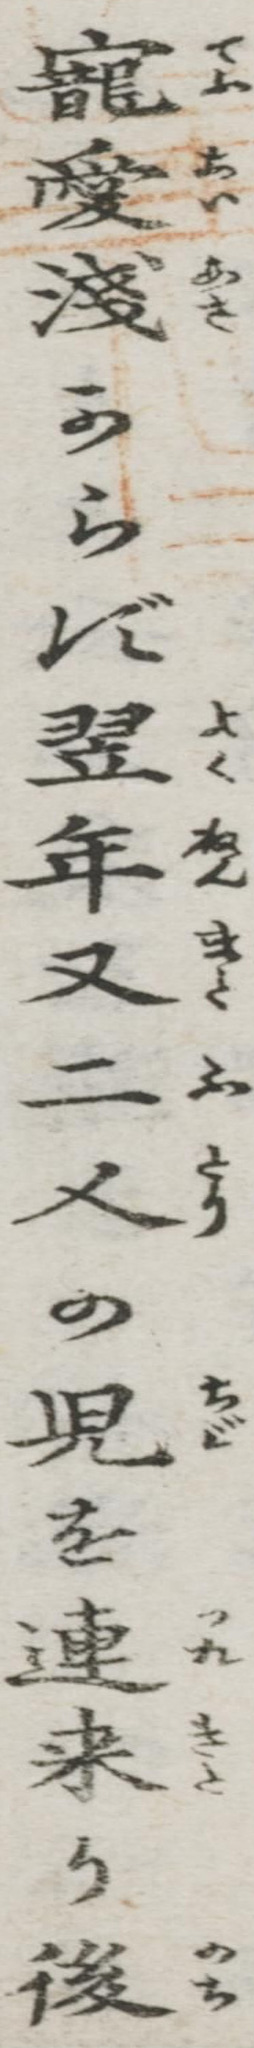寵愛浅からず翌年又二人の児を連来り後
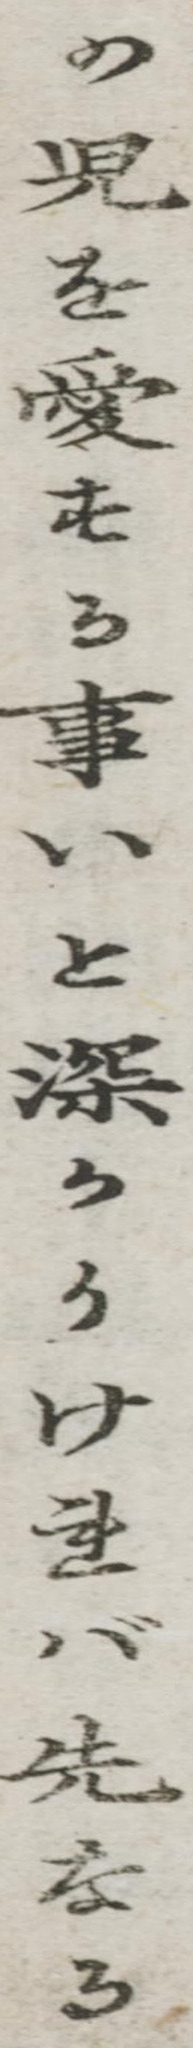の児を愛する事いと深かりければ先なる

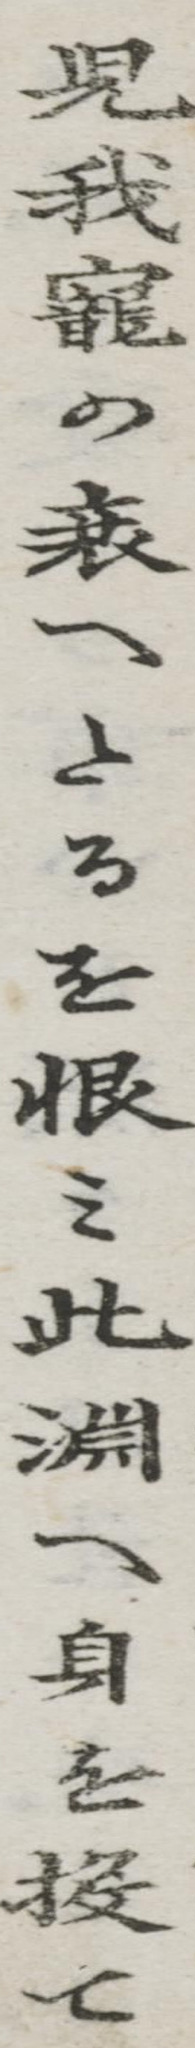児我寵の衰へたるを恨み此淵へ身を投て
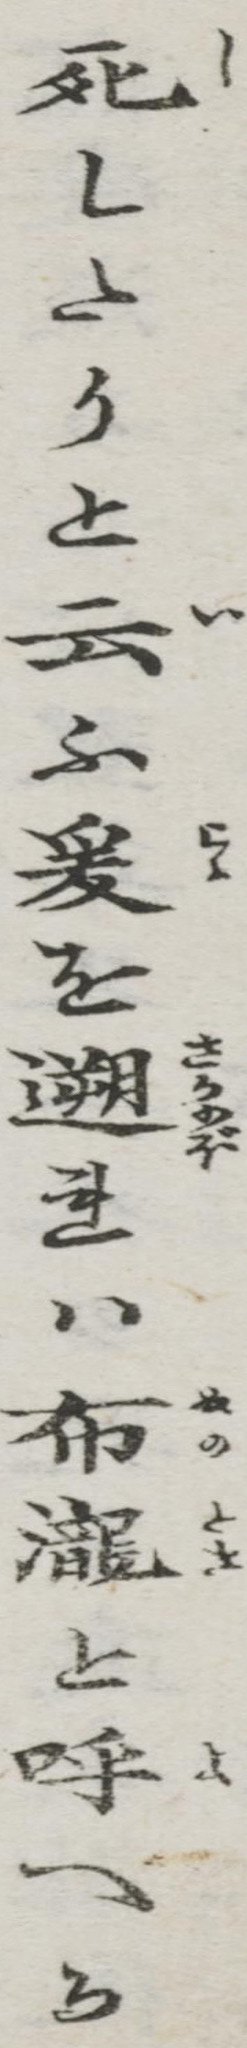死したりと云ふ爰を遡れは布滝と呼へる
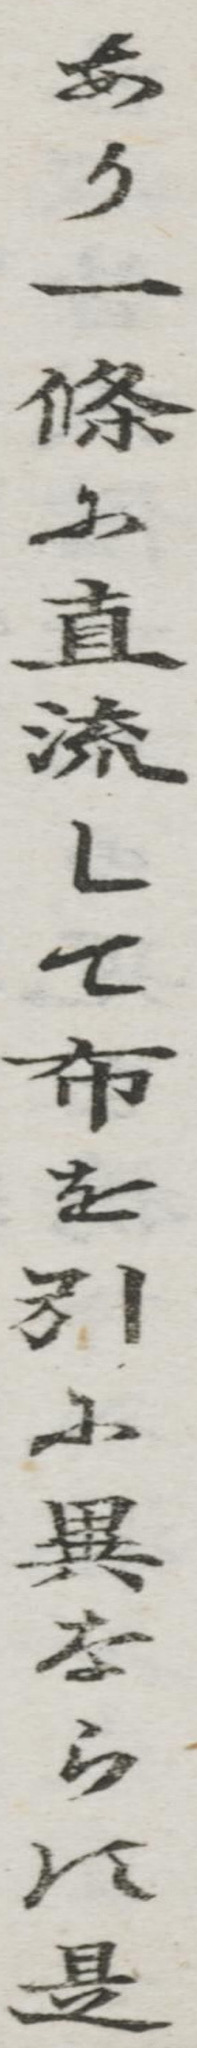あり一条に直流して布を引に異ならす是
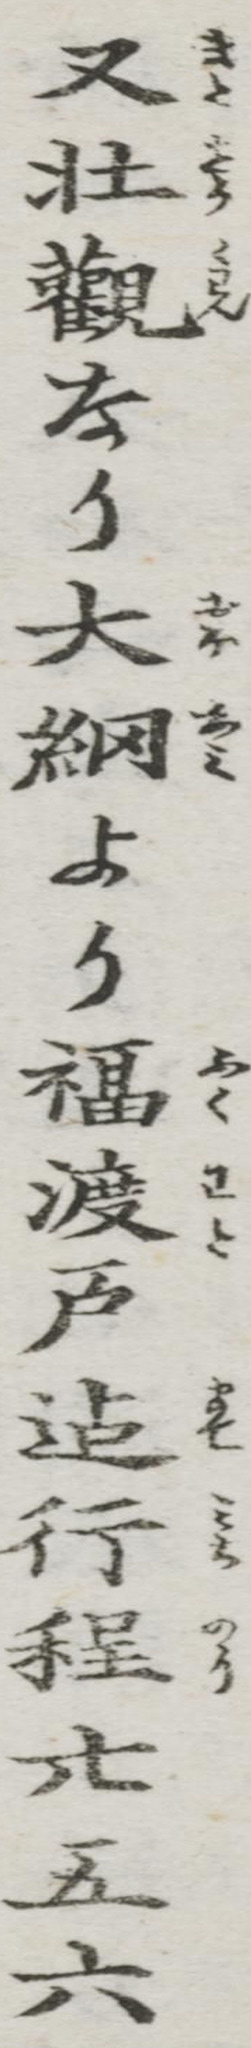又壮観なり大網より福渡戸迄行程廿五六
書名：塩原繁昌記　全
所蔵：東京大学地震研究所図書室 Earthquake Research Institute Library, The University of Tokyo, JAPAN
